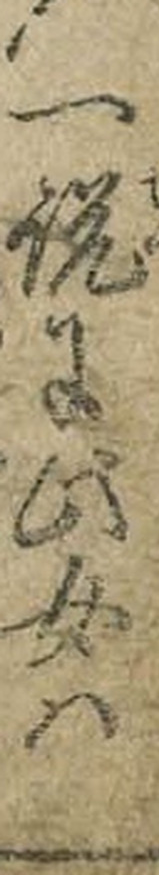一説に此女は
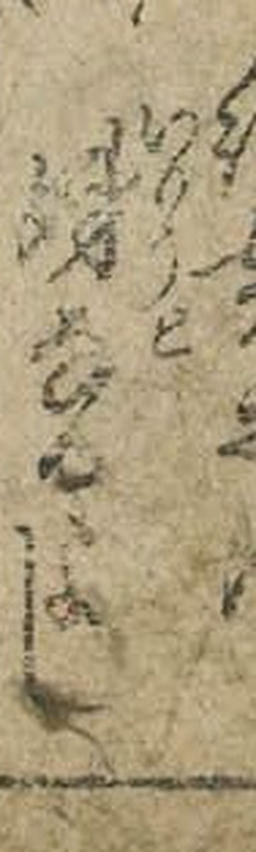妹なるよし
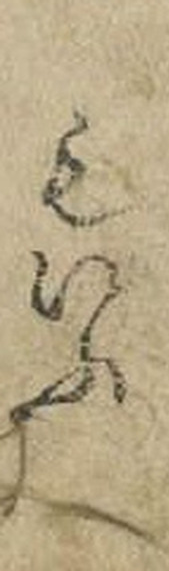もいふ
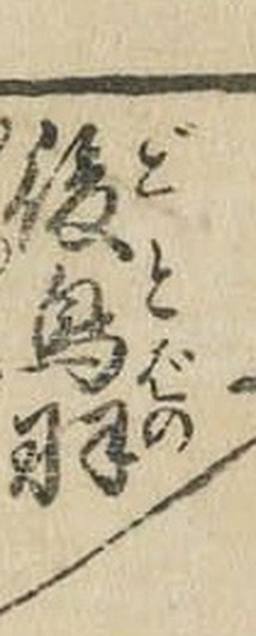後鳥羽
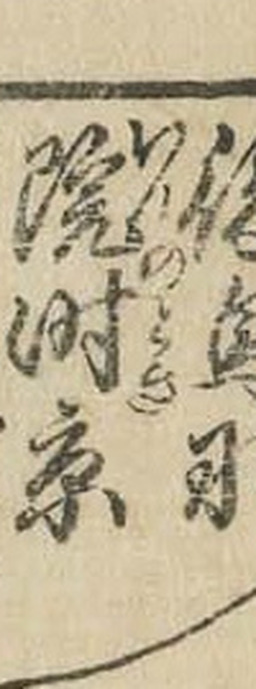院時京
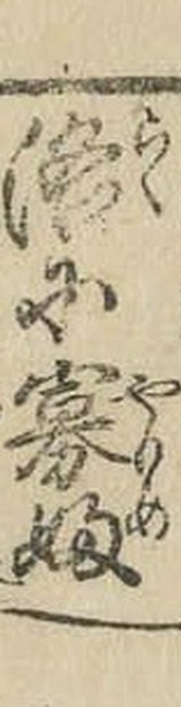洛に寡婦
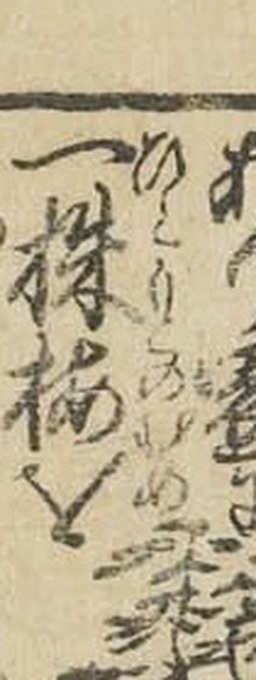一株梅を
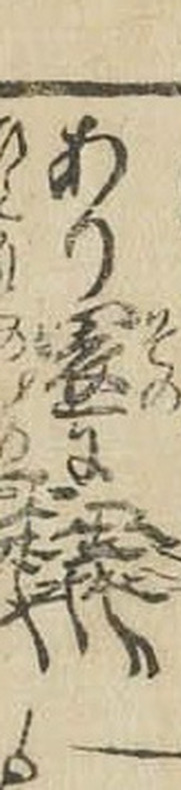あり園に
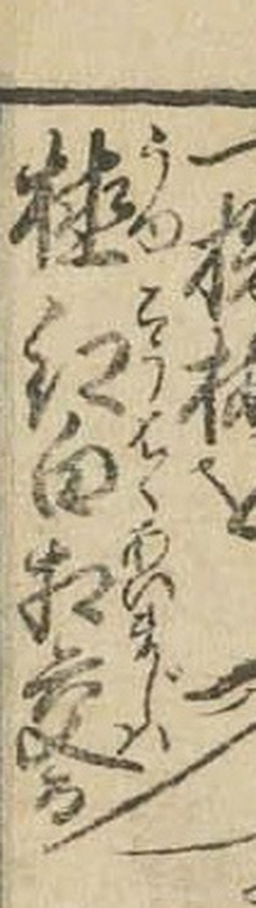植紅白相交る
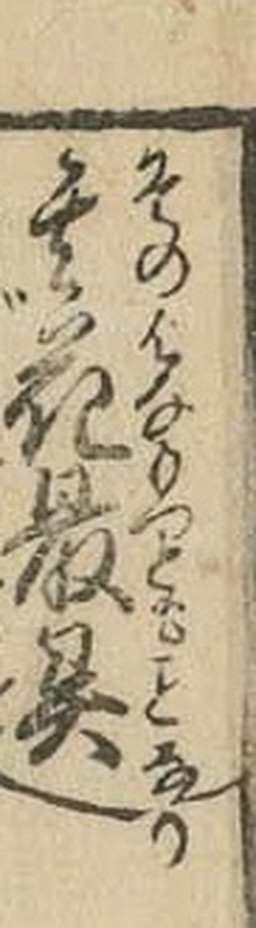其花最異
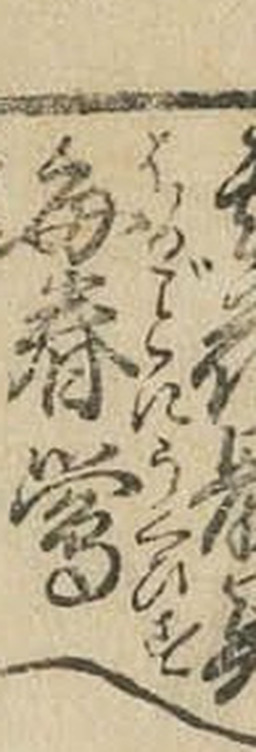毎春鶯
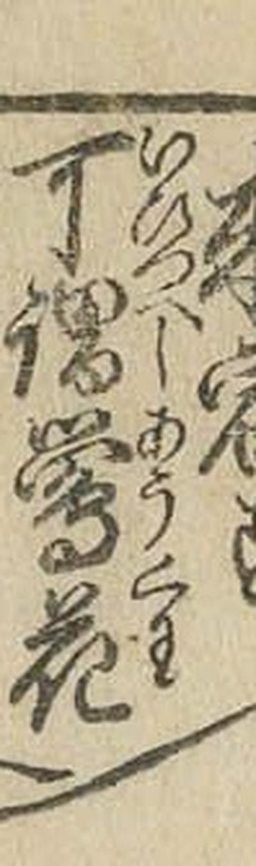可謂鶯花
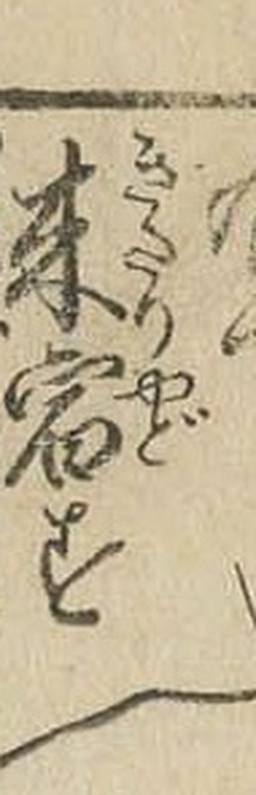来宿す
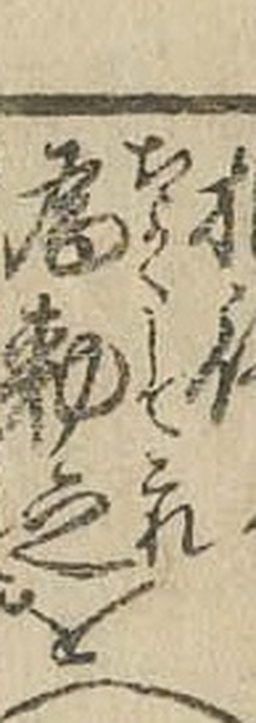為勅之を
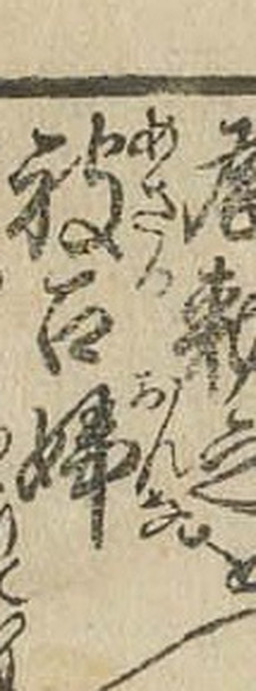被召婦
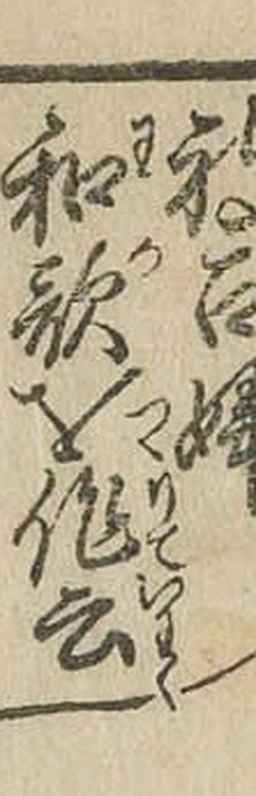和歌を作云
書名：絵本写宝袋 9巻 1之巻
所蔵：東京学芸大学教育コンテンツアーカイブ
